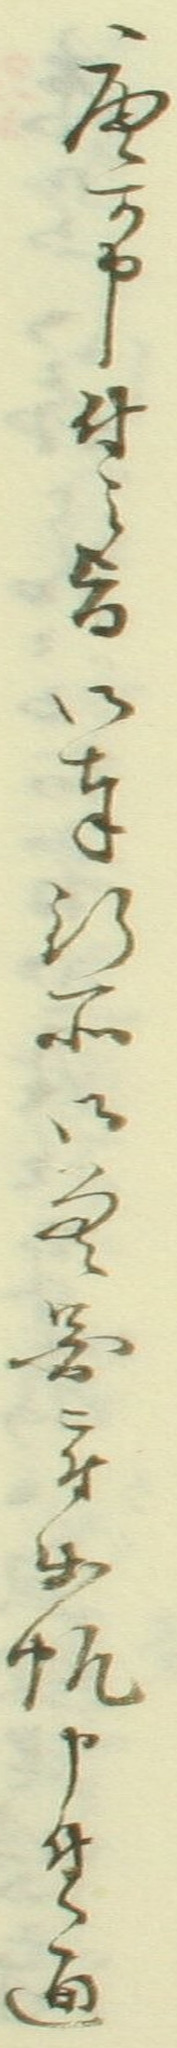唐可申付之旨御奉行所御差図に付出帆申付之通

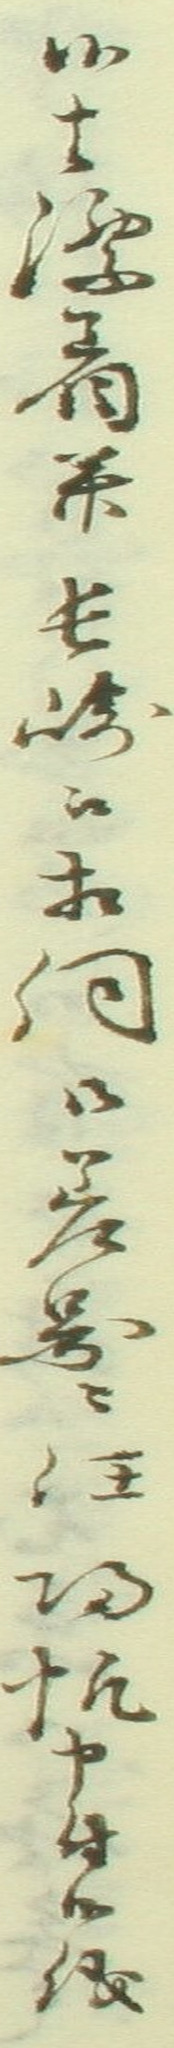候は漂着并長崎え相伺御差図に任帰帆申付候儀
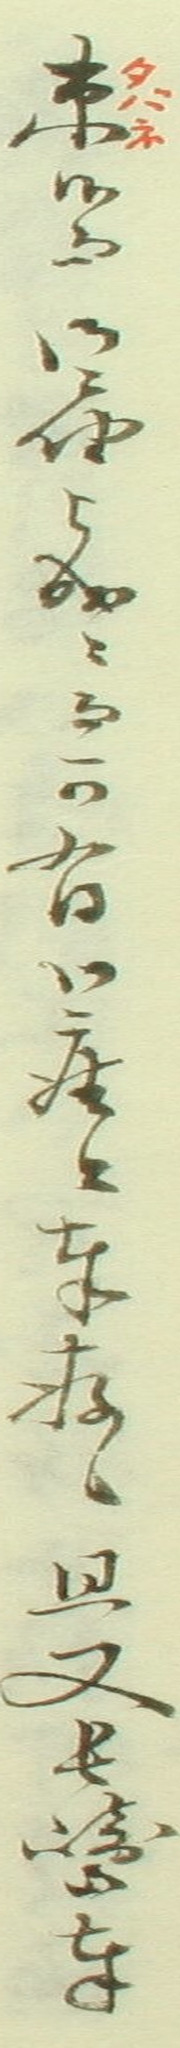束候而御届被成候而可有御座と奉存候且又長崎御奉
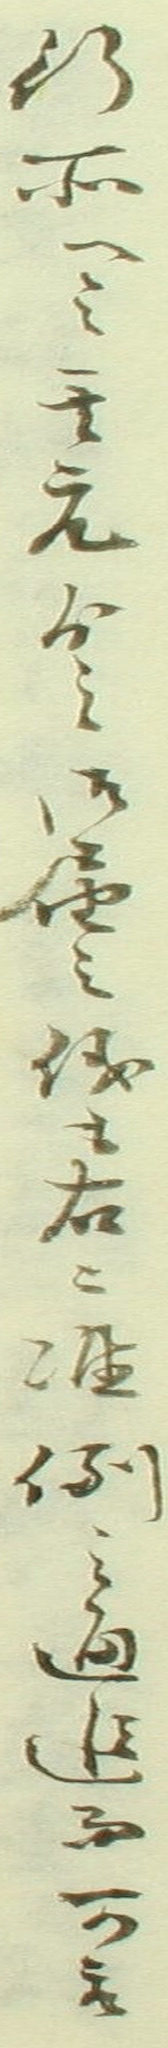行所へ之其元ゟ之御届之儀も右に准例之通追而可被
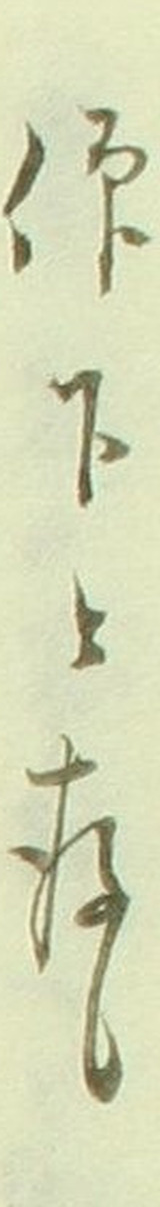仰下と存候
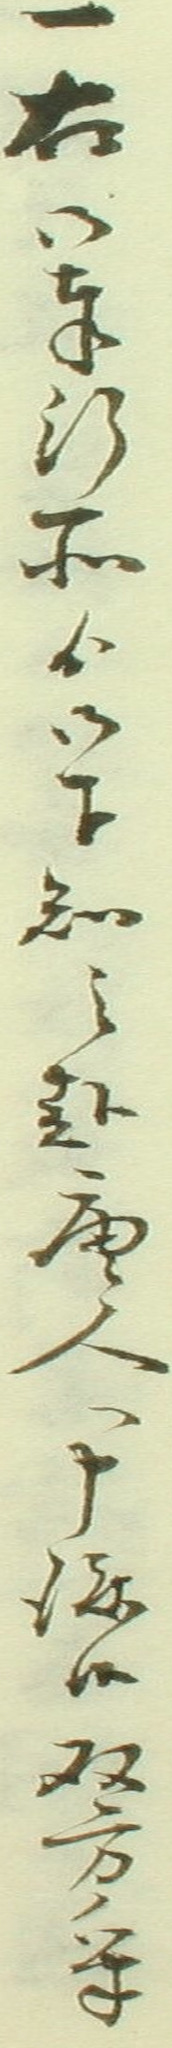一右は御奉行所ゟ御下知之赴唐人へ申渡候双方ノ筆
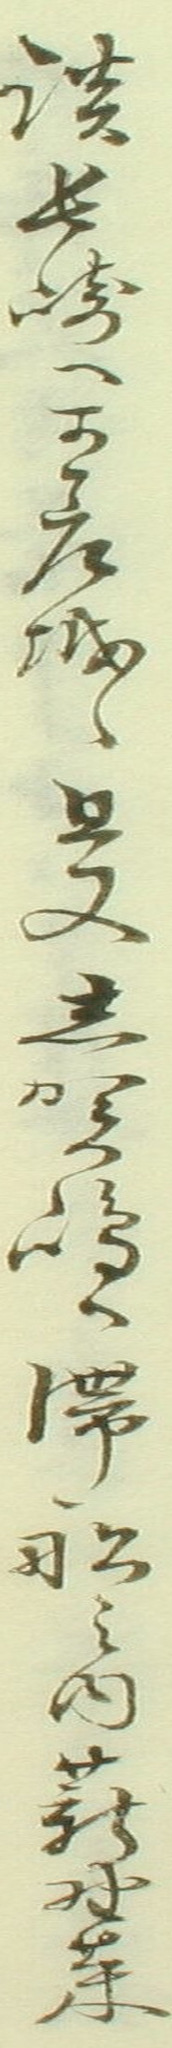談長崎へ可差越候且又志賀島へ隊滞船之内薪野菜
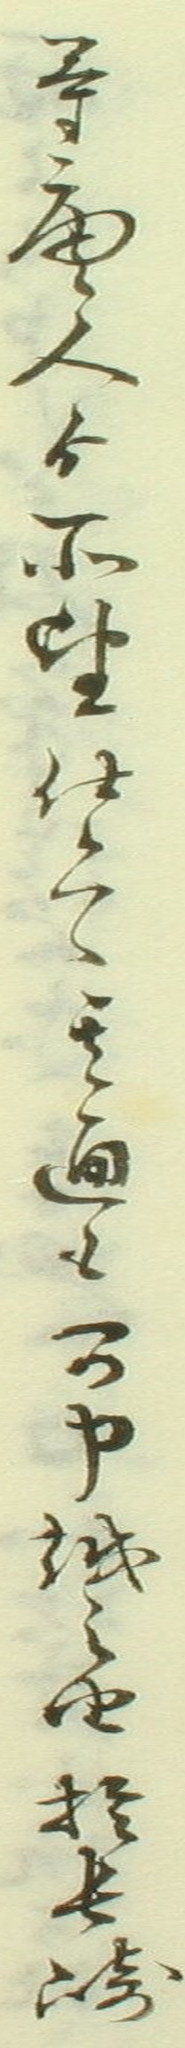等唐人ゟ所望仕候はゝ其通も可申越之由於長崎
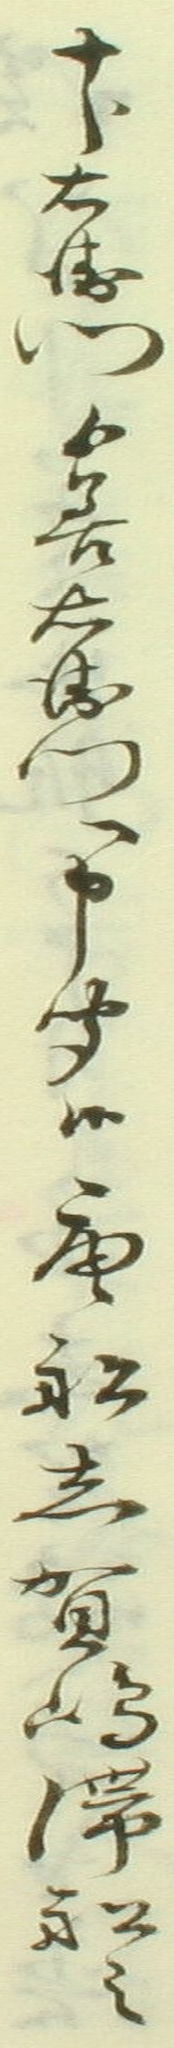十郎右衛門ゟ善右衛門へ申聞候唐船志賀島滞船之
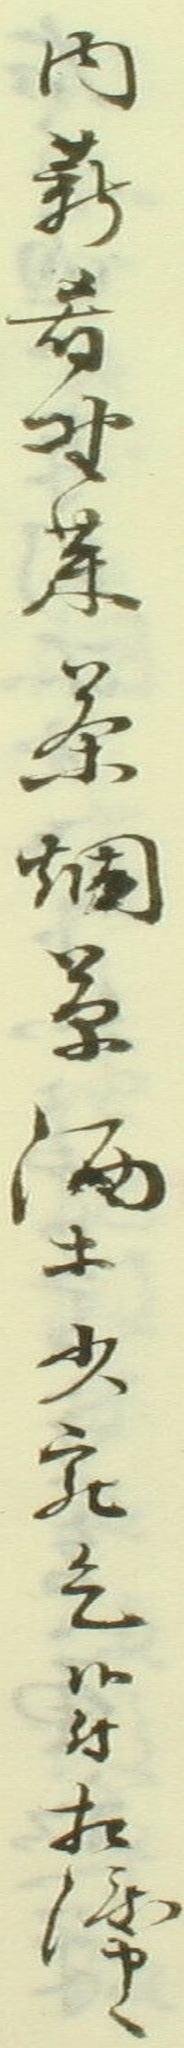内薪肴野菜茶烟草酒抔少宛乞候付相渡申候
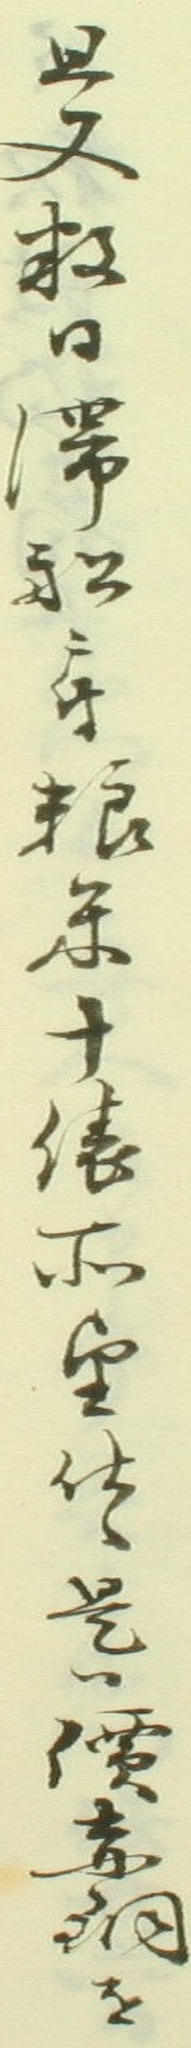且又数日滞船に付粮米十俵所望仕候是は価赤銅を
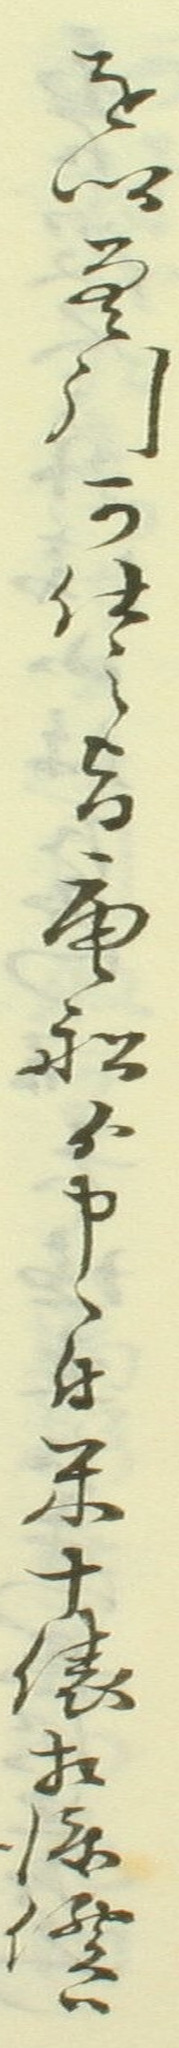を以差引可仕之旨唐船ゟ申候付米十俵相渡価は
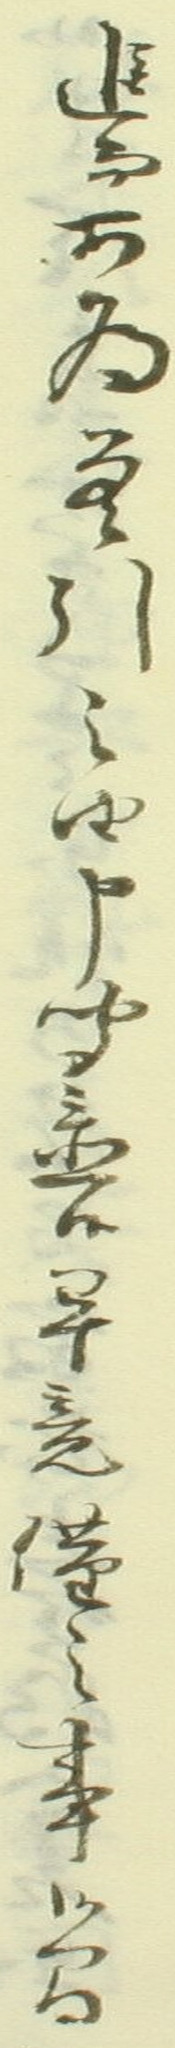追而可為差引之由申聞置候畢竟僅之事候間
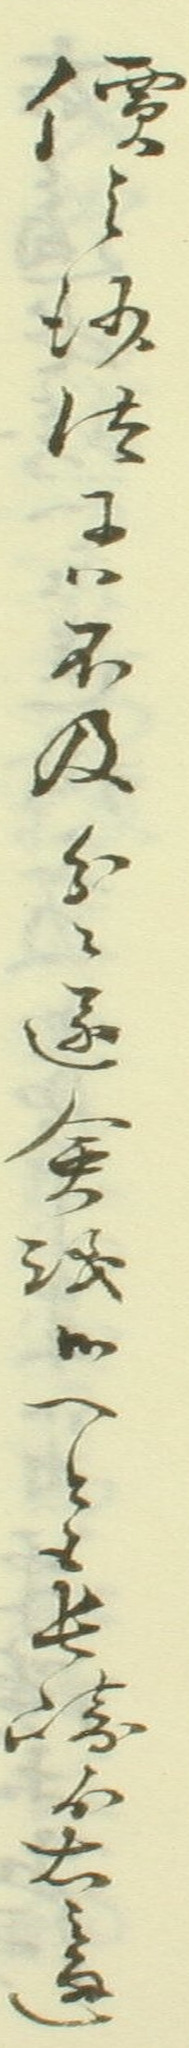価之沙汰には不及分に遂僉議候へとも長崎ゟ右之通
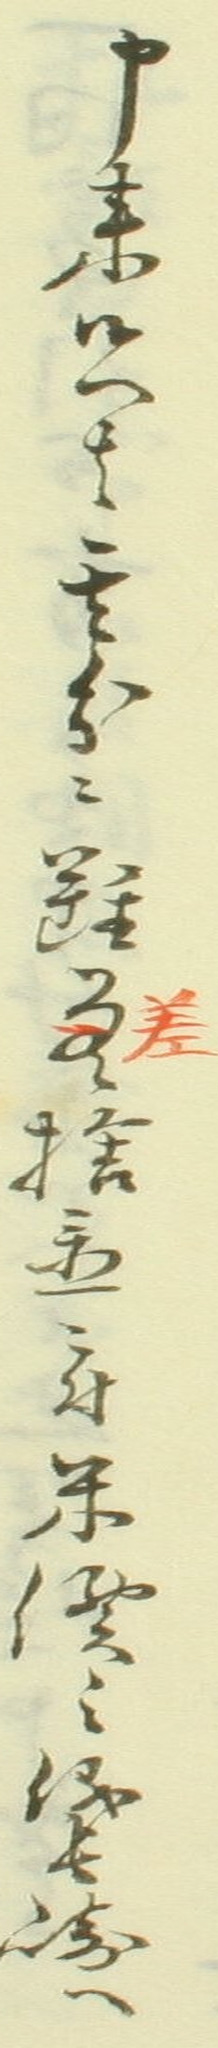申来候へは其分に難差捨置に付ば米価之儀長崎へ
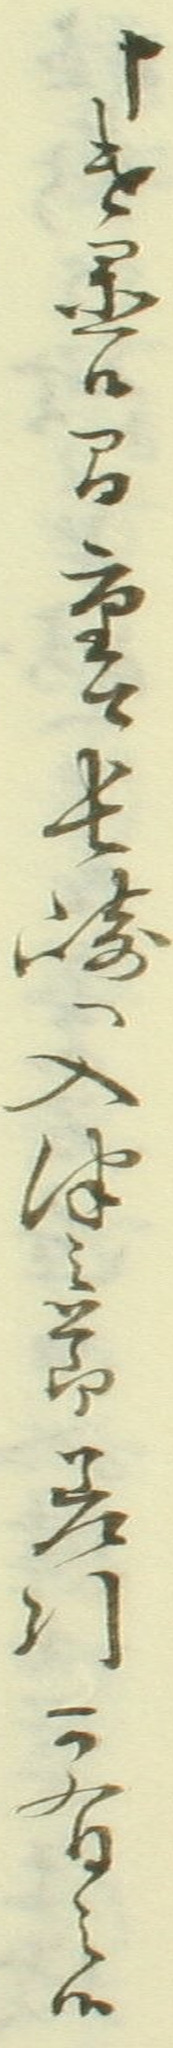申遣置候間重て長崎へ入津之差引可有之候
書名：異国船漂着記
